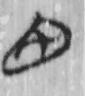甶（思）
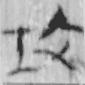攻
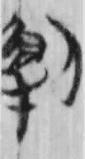解
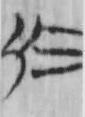於
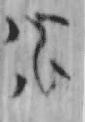水
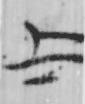上
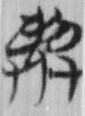與
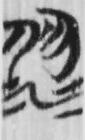溺
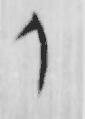人
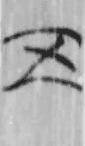五
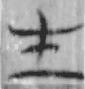生
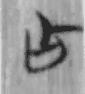占
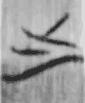之
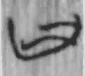曰
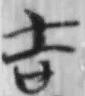吉
